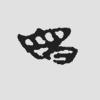晦
